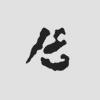君
